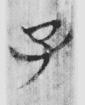子
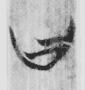曰
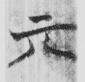亓
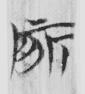所
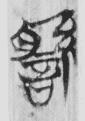䌛
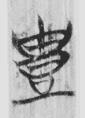豊
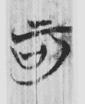可
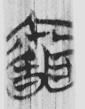{尒䎽}
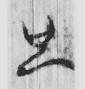也
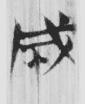成
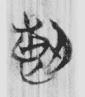{叀刃}
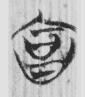合
